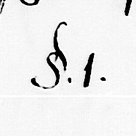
§. 1.
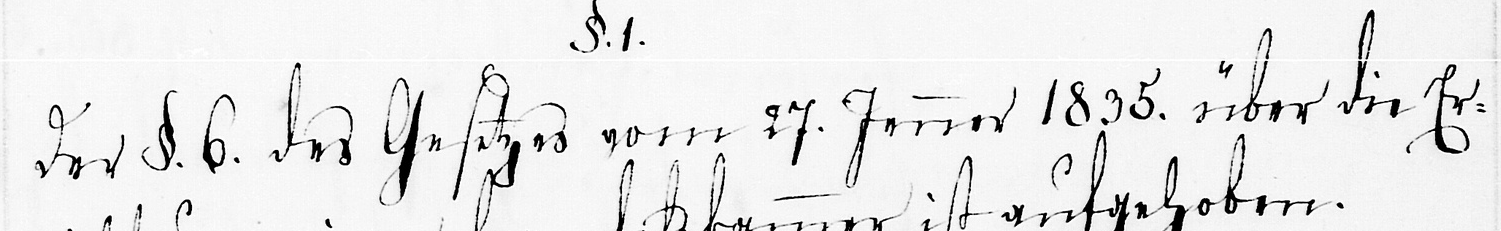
Der §. 6. des Gesetzes vom 27. Jenner 1835. über die Er¬
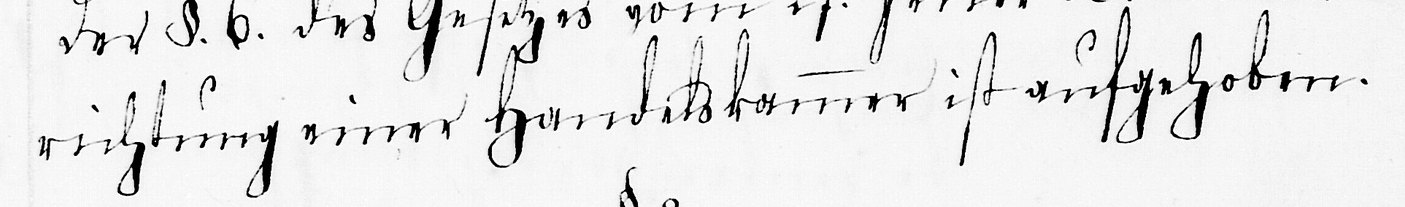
richtung einer Handelskammer ist aufgehoben.
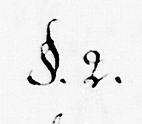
§. 2.
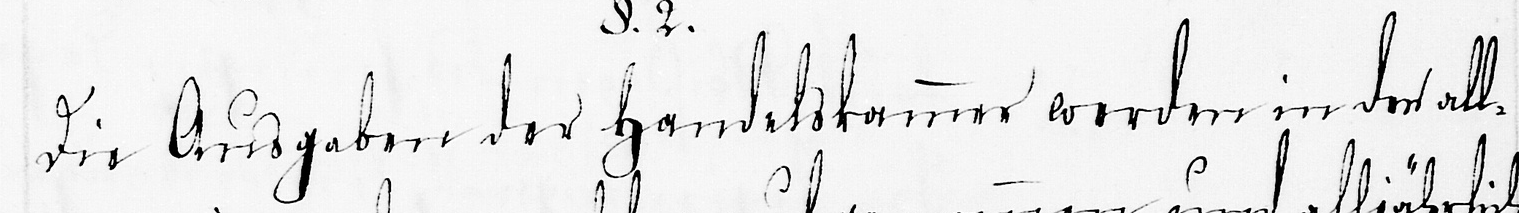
Die Ausgaben der Handelskammer werden in den al¬
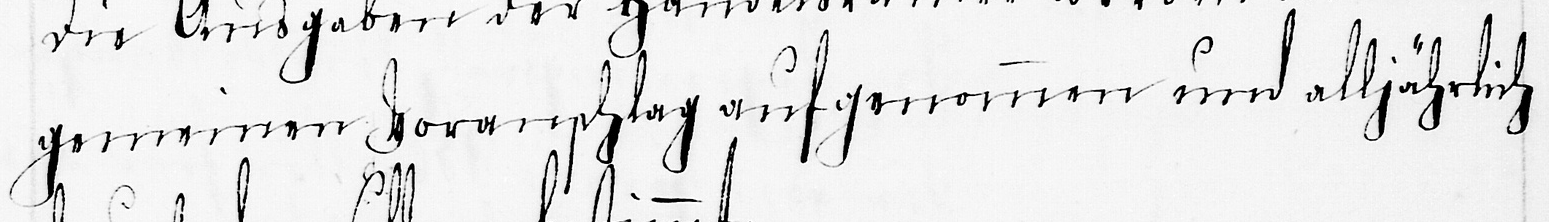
lgemeinen Voranschlag aufgenommen und alljährlich
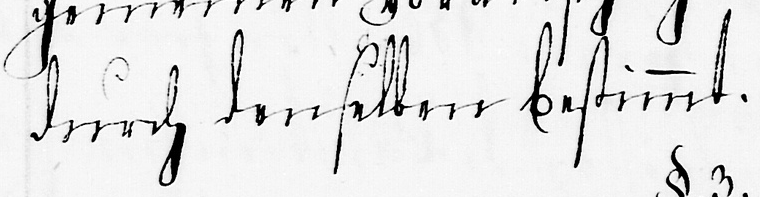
durch denselben bestimmt.
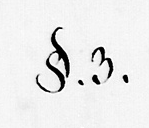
§. 3.
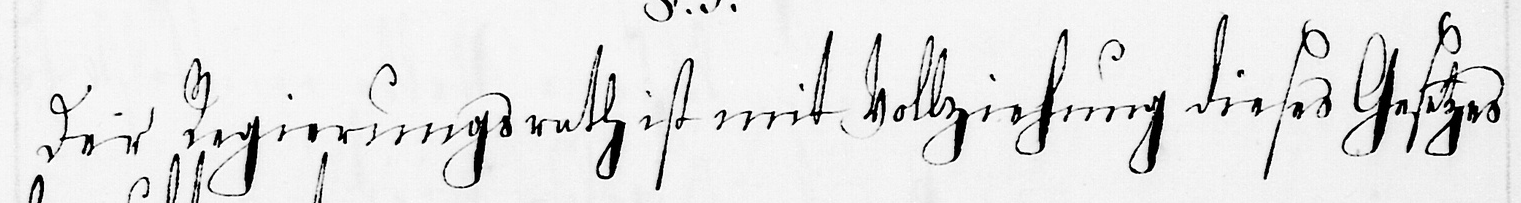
Der Regierungsrath ist mit Vollziehung dieses Gesetzes
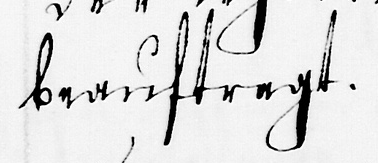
beauftragt.
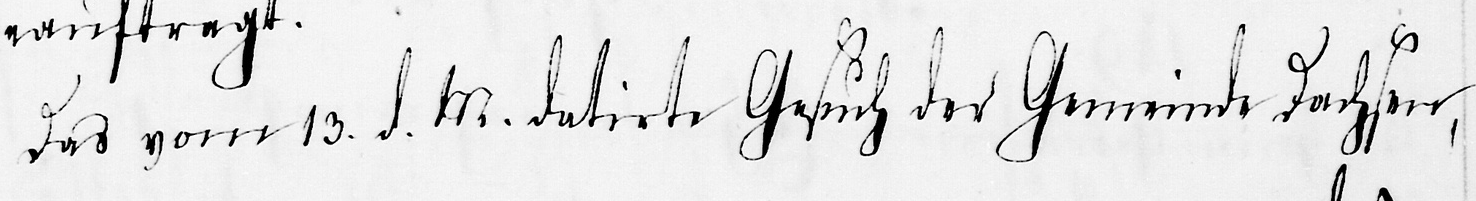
Das vom 13. d. M. datirte Gesuch der Gemeinde Dachsen,
